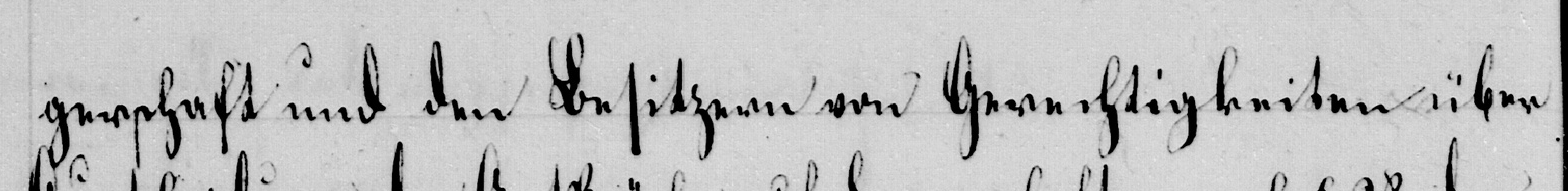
gerschaft und den Besitzern von Gerechtigkeiten über
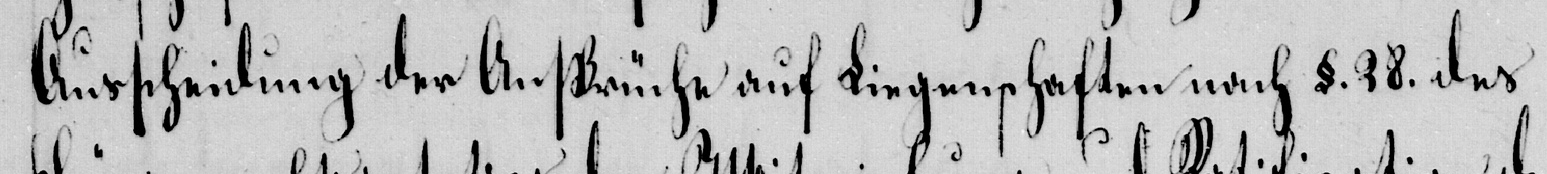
Ausscheidung der Ansprüche auf Liegenschaften nach §. 38. des
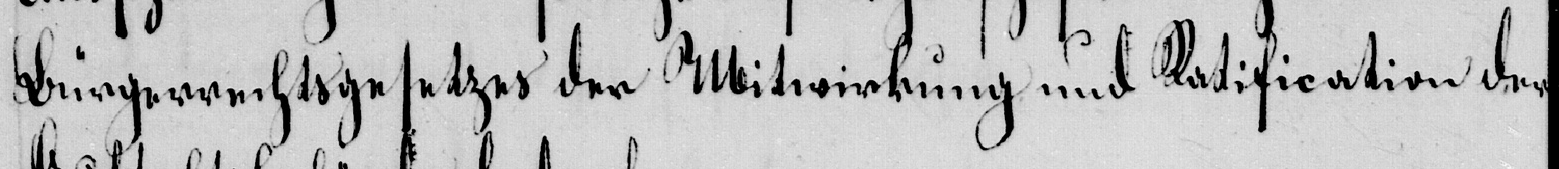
Bürgerrechtsgesetzes der Mitwirkung und Ratification der
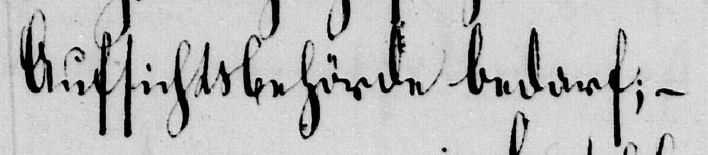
Aufsichtsbehörde bedarf; –
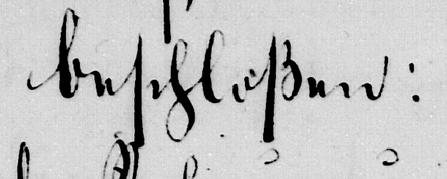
beschloßen:
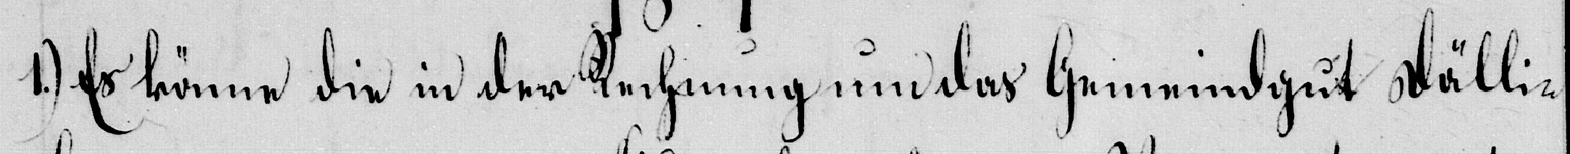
1.) Es können die in der Rechnung um das Gemeindgut Dälli¬
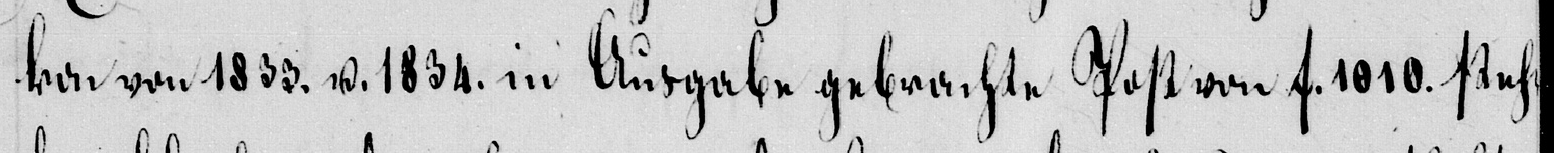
kon von 1833. u. 1834. in Ausgabe gebrachte Post von f. 1010. ste¬
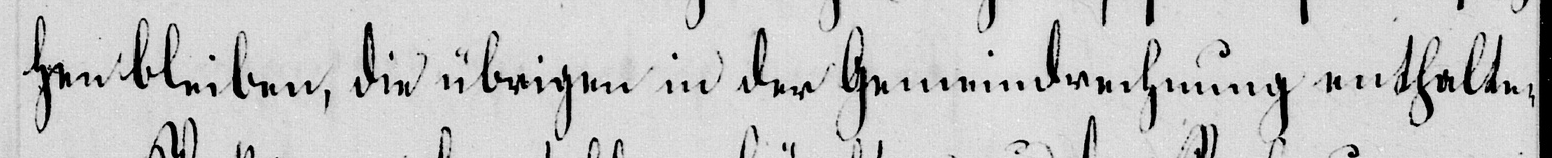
hen bleiben, die übrigen in der Gemeindrechnung enthalte¬
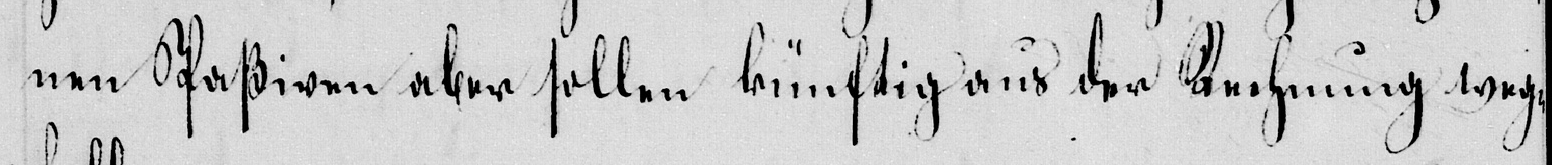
nen Paßiven aber sollen künftig aus der Rechnung we¬
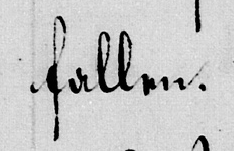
gfallen.
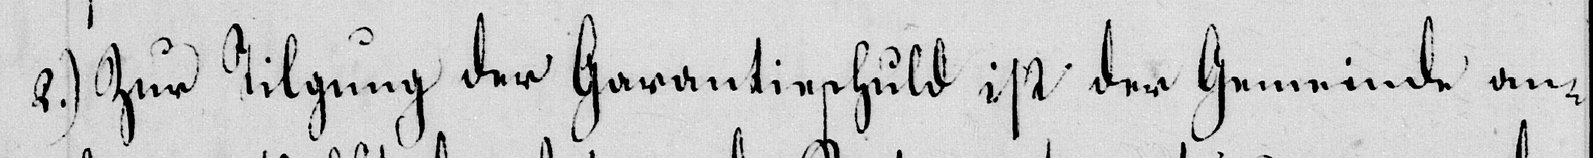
2.) Zur Tilgung der Garantieschuld ist der Gemeinde an¬
